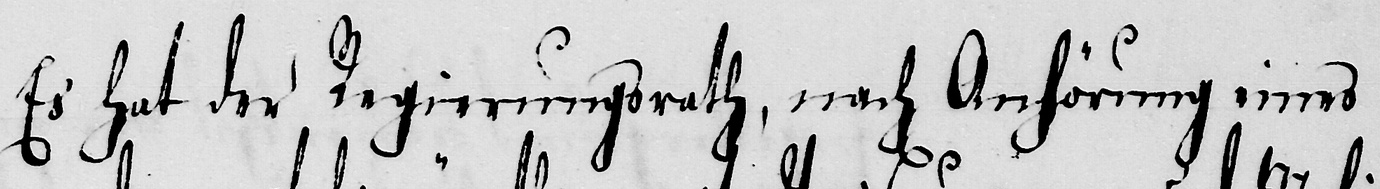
Es hat der Regierungsrath, nach Anhörung eines
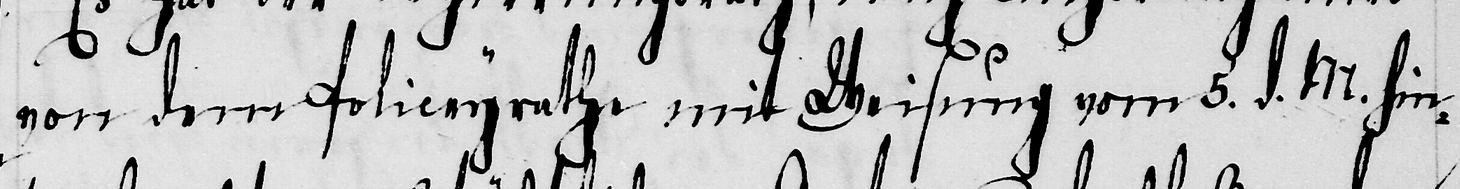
von dem Policeyrathe mit Weisung vom 5. d. M. hin¬
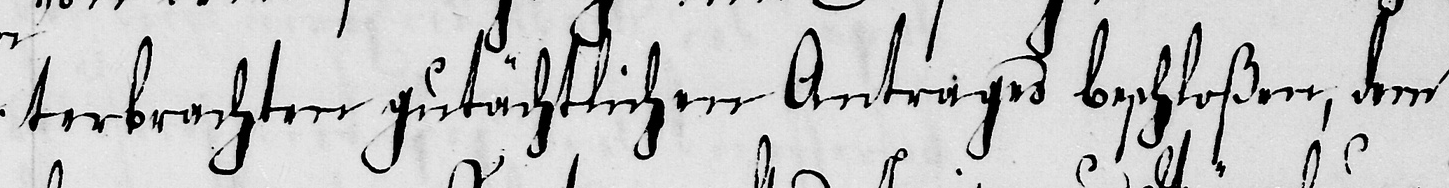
terbrachten gutächtlichen Antrages beschloßen, dem
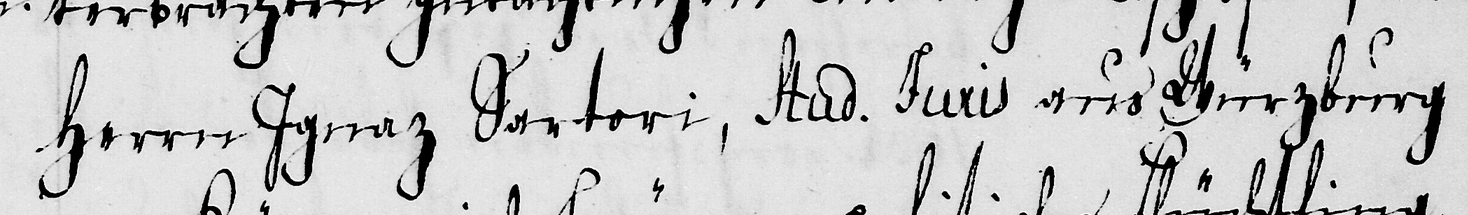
Herrn Ignaz Sartori, Stud. Juris aus Würzburg
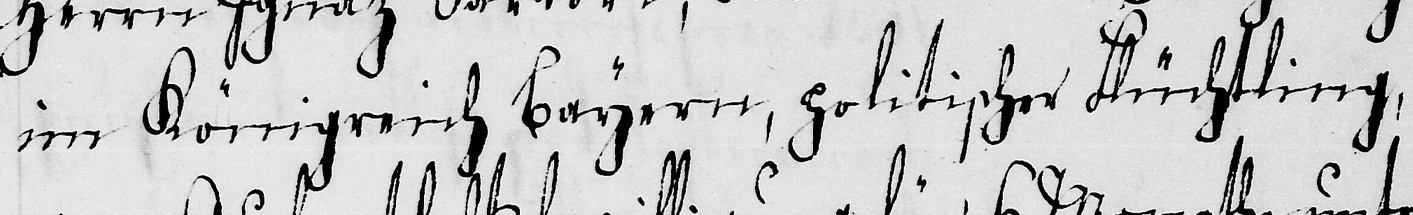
im Königreich Bayern, politischer Flüchtling,
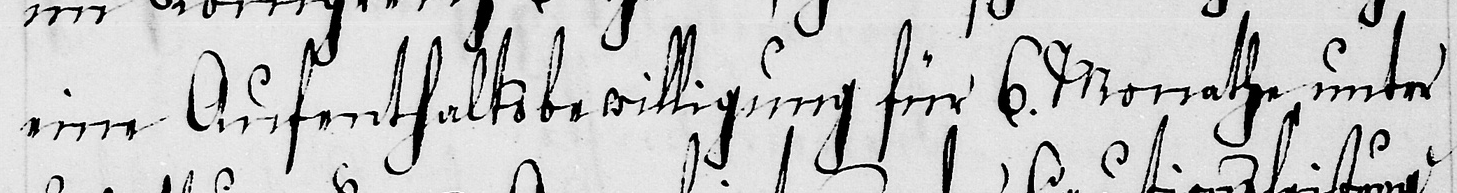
eine Aufenthaltsbewilligung für 6. Monathe unter
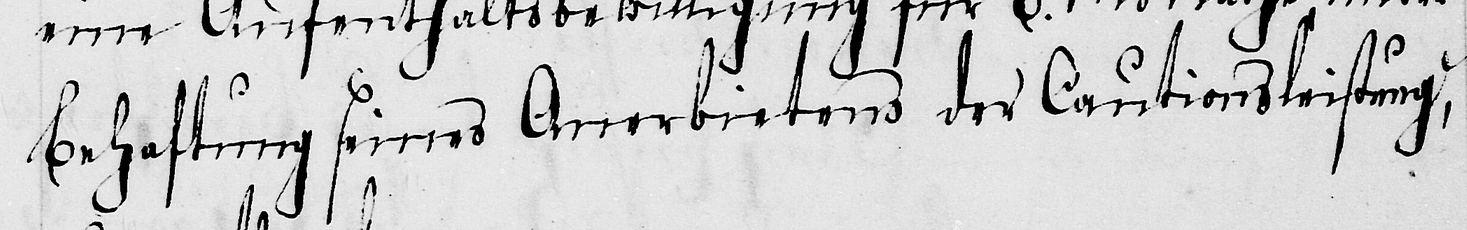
Behaftung seines Anerbietens der Cautionsleistung,
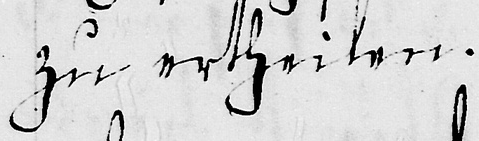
zu ertheilen.
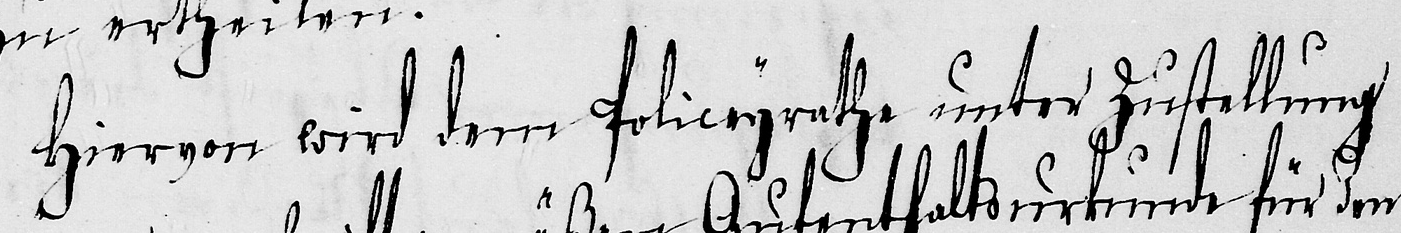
Hiervon wird dem Policeyrathe unter Zustellung
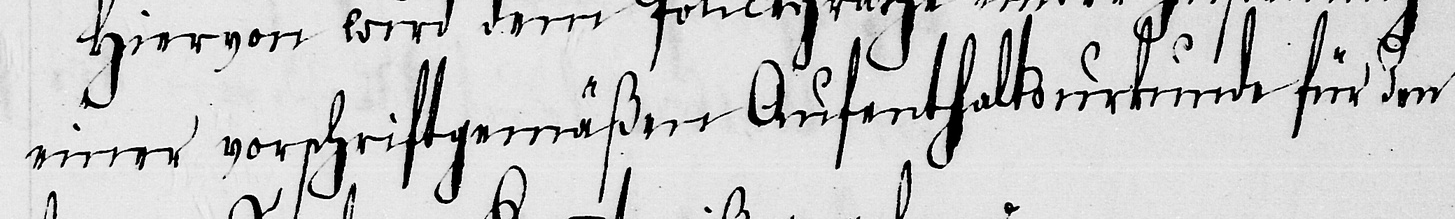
einer vorschriftgemäßen Aufenthaltsurkunde für den
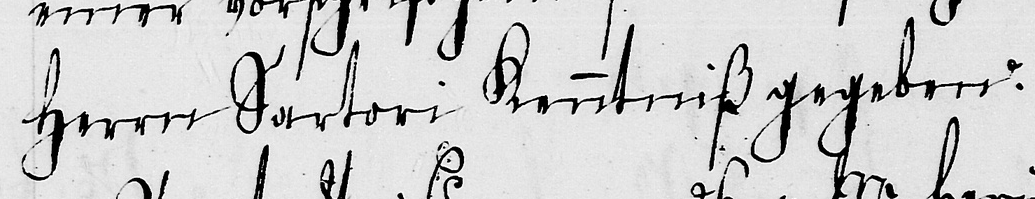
Herrn Sartori Kenntniß gegeben.
